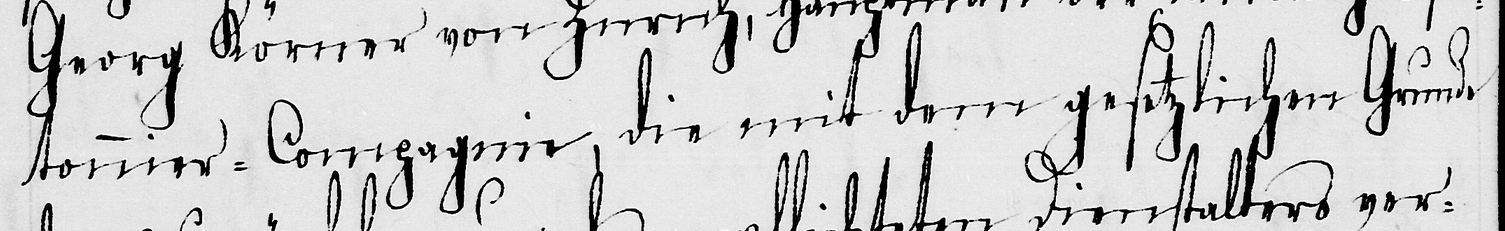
tonnier-Compagnie, die mit dem gesetzlichen Grunde
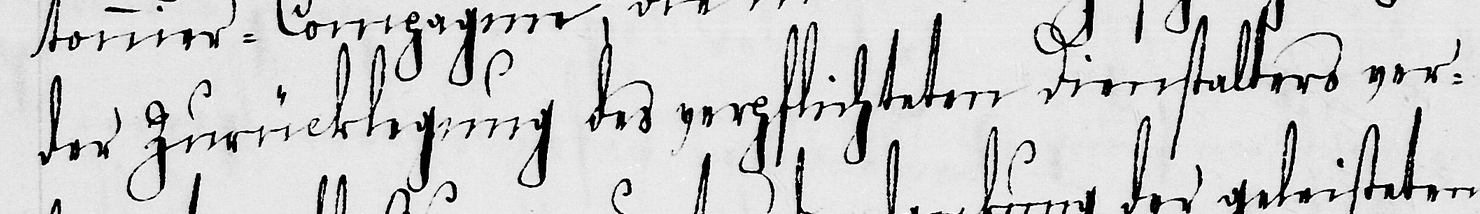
der Zurücklegung des verpflichteten Dienstalters ver¬
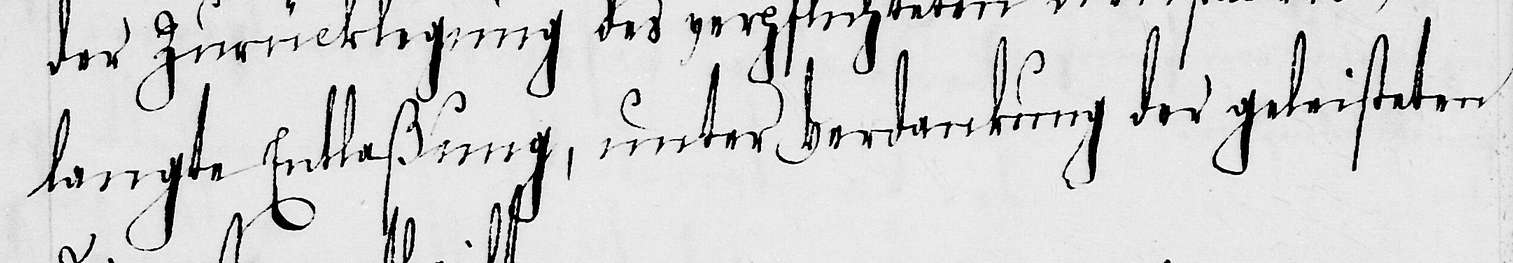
langte Enltaßung, unter Verdankung der geleisteten
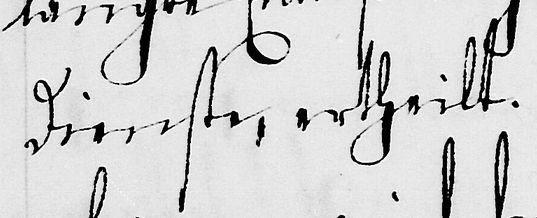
Dienste, erhteilt.
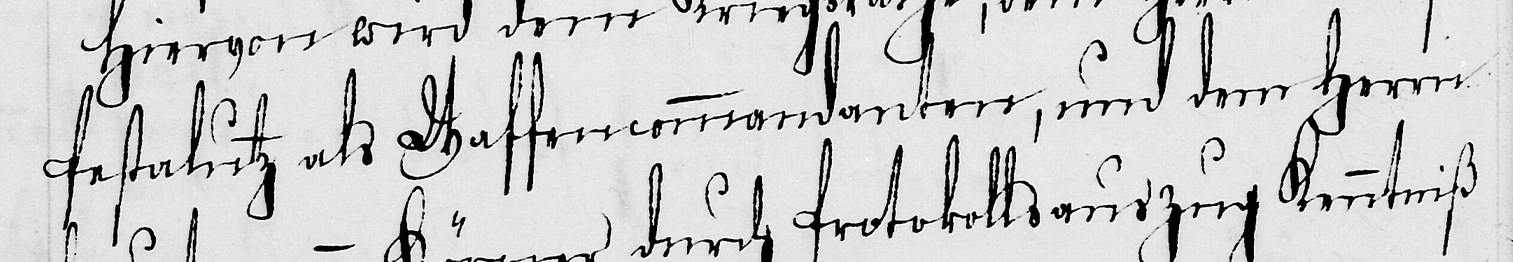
Pestalutz als Waffencommandanten, und dem Herrn
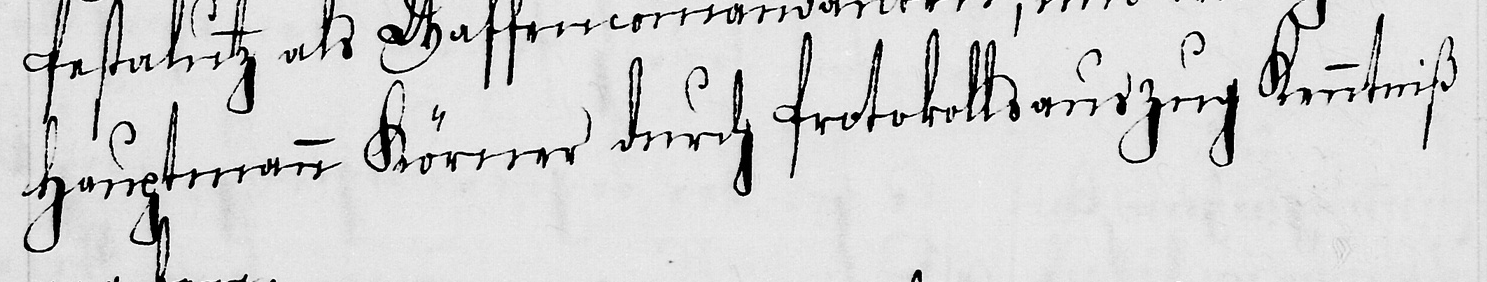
Hauptmann Körner durch Protokollsauszug Kenntniß
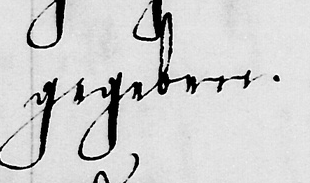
gegeben.
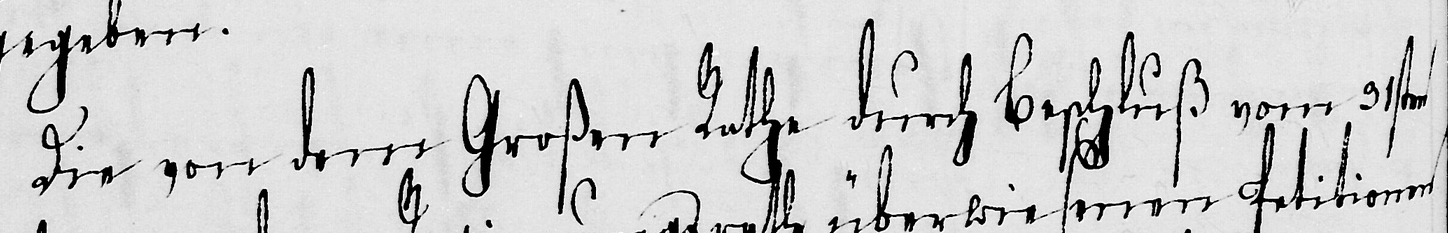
Die von dem Großen Rathe durch Beschluß vom 31s¬
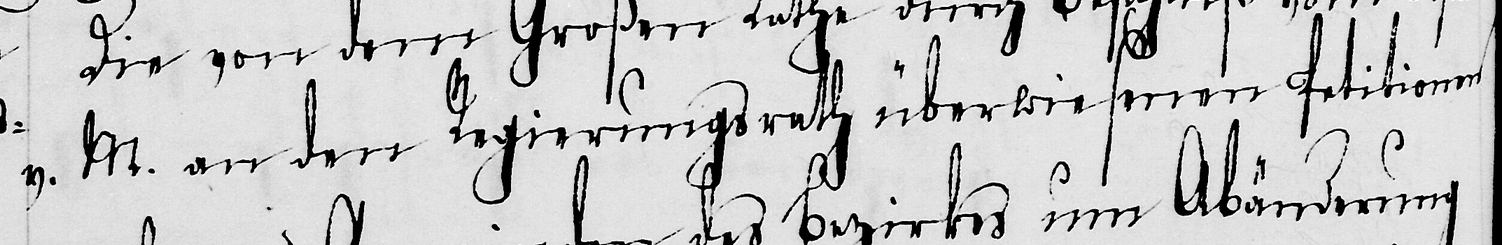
v. M. an den Regierungsrath überwiesenen Petitionen
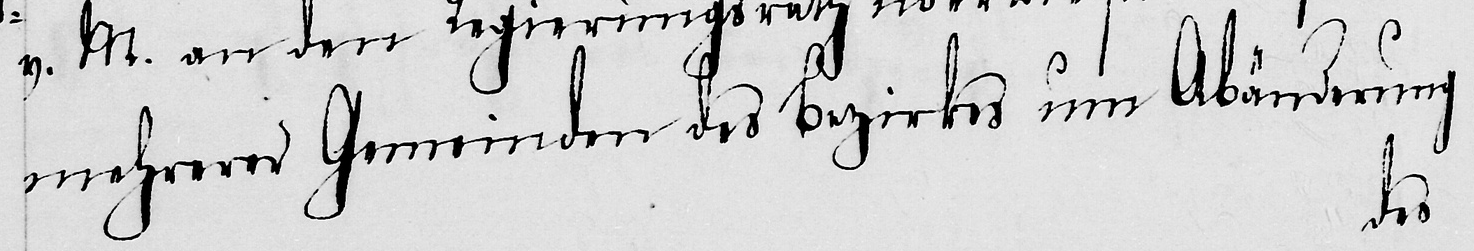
mehrerer Gemeinden des Bezirkes um Abänderung
